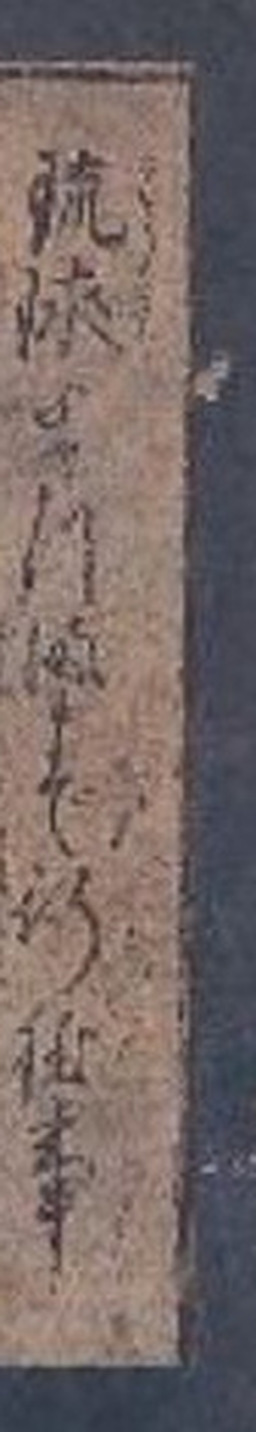琉球よりさつままで行程事
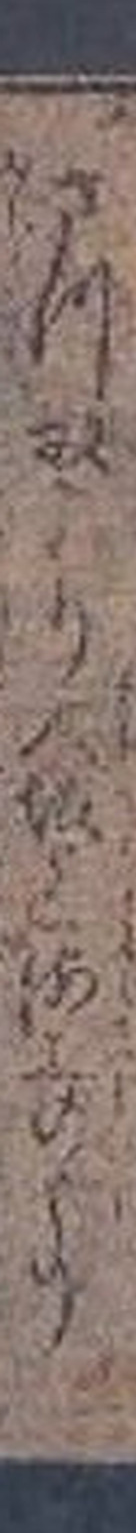さつまより大坂迄海上の事
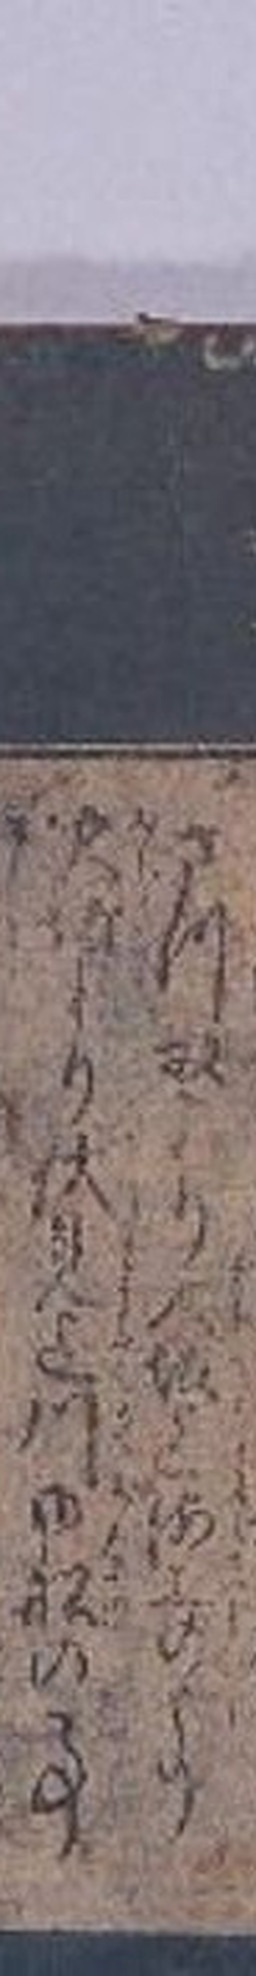大坂より伏見迄川御船の事
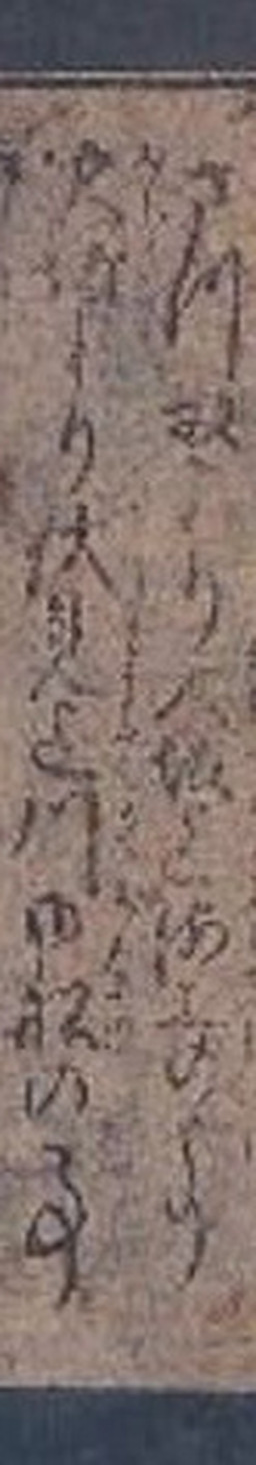大坂より伏見迄川御船の事
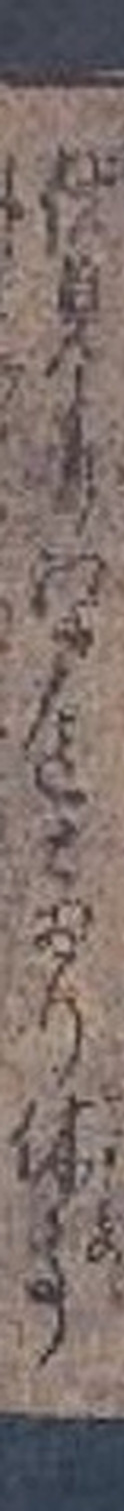伏見より江戸迄とまり休事
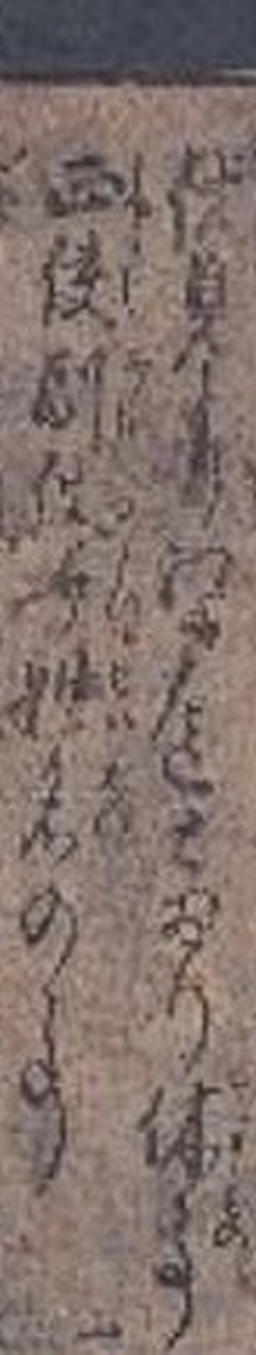正使副使并姓名の事
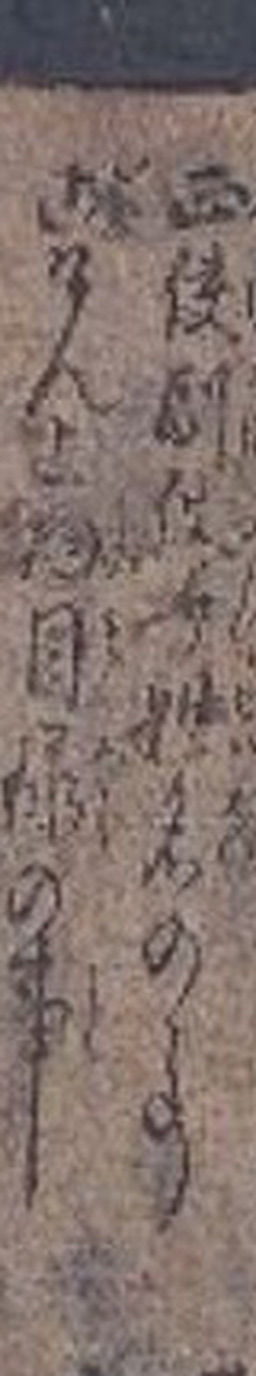御けん上物目録の事
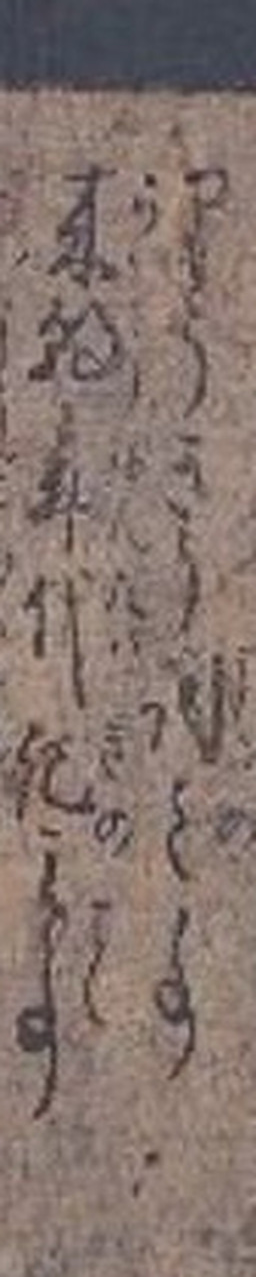来朝年代記之事
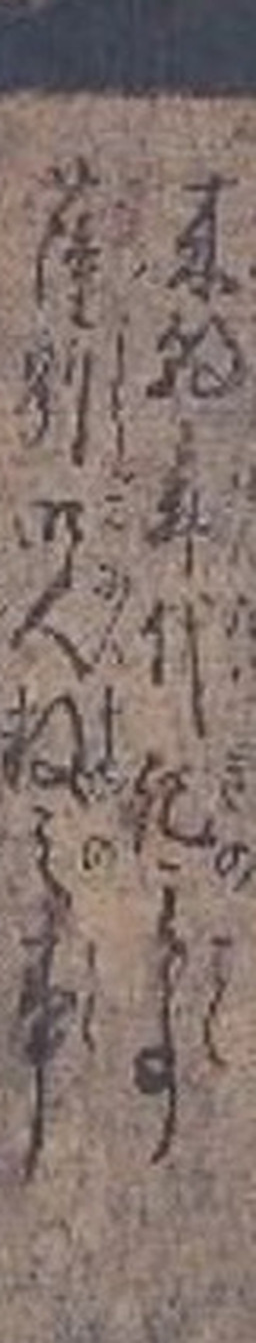薩州御人数之事
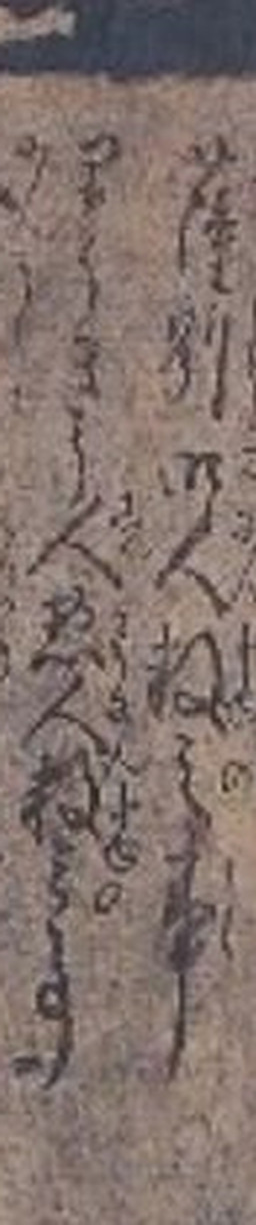りうきう人惣人数之事

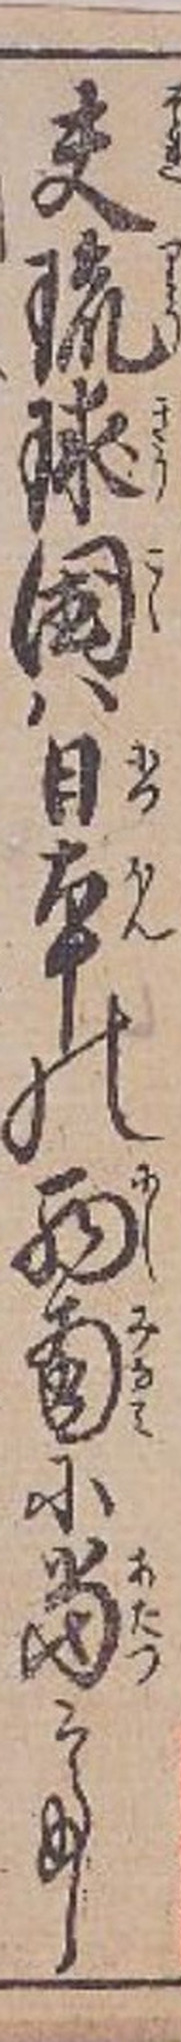夫琉球国は日本の西南に当て
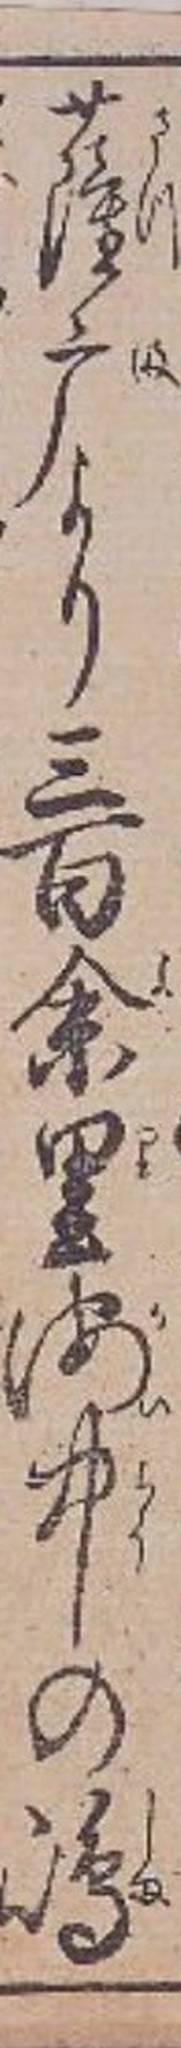薩摩より三百余里海中の嶋
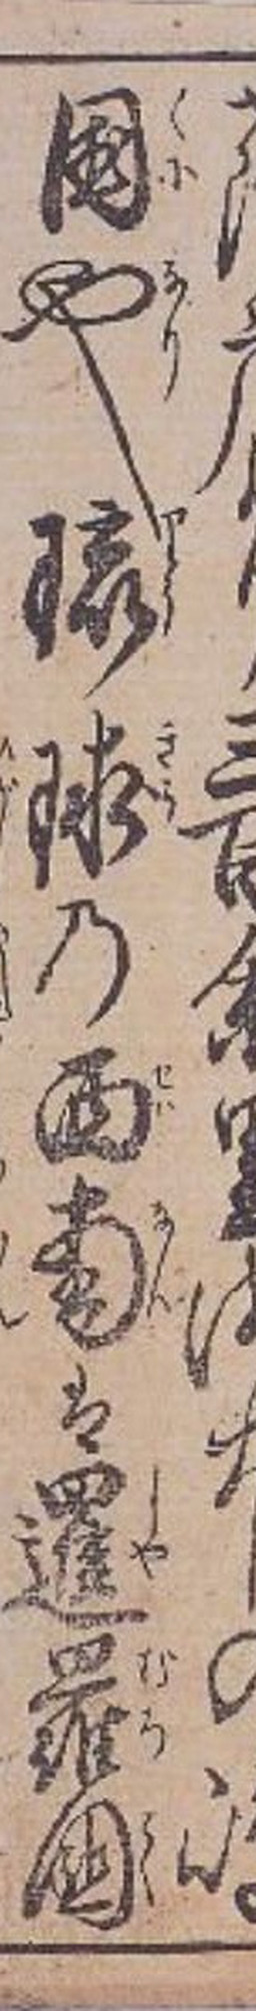国也琉球の西南は暹羅国
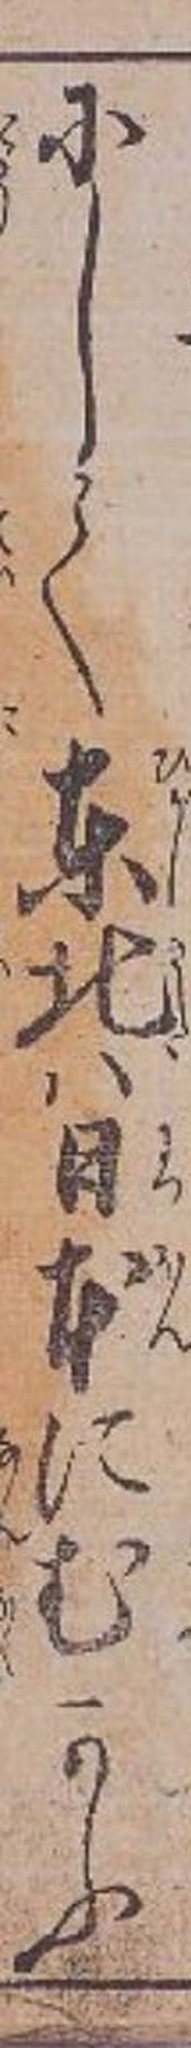にして東北は日本にむかふ
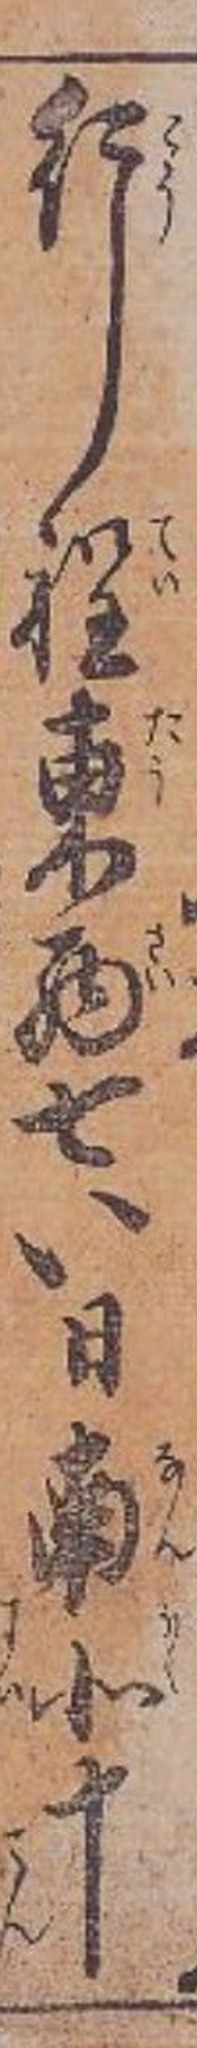行程東西七八日南北十
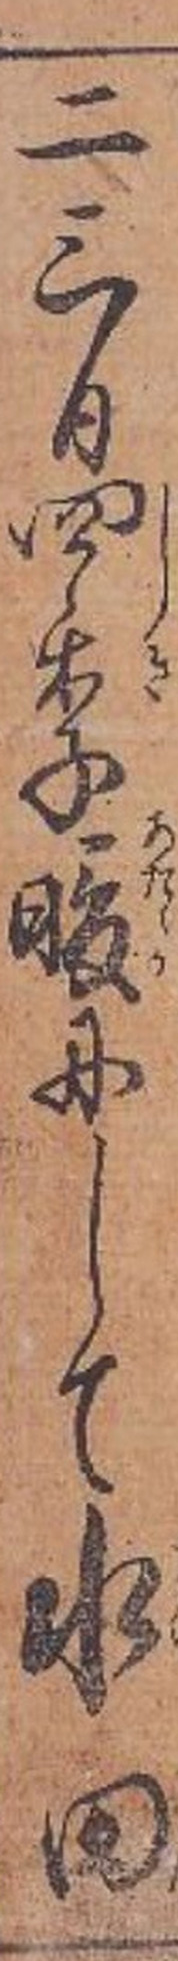二三日四季暖にして水田
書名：琉球人大行列記 大全 来朝新板絵入
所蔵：University of the Ryukyus Library
